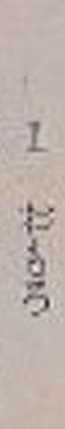１おもろ
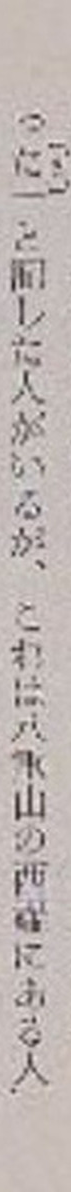った」と記した人がいるが、これは八重山の西端にある人
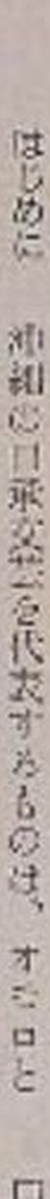はじめに沖縄の口承文芸を代表するものは、オモロと
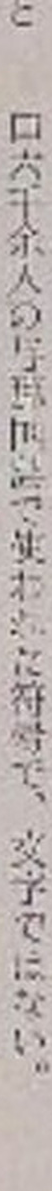口六千余人の与那国島で使われた符号で、文字ではない。
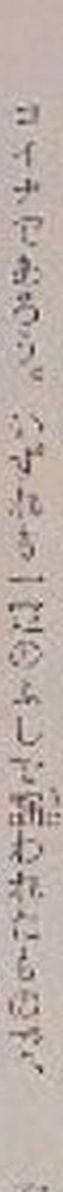コイナであろう。いずれも一定のふしで謡われたもので、
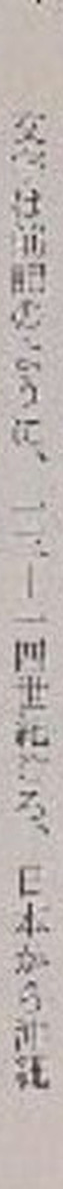文字は前記のように、一三―一四世紀ごろ、日本から沖縄
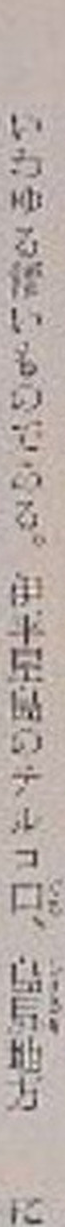いわゆる謡いものである。伊平屋島のテルコ口、島尻地方
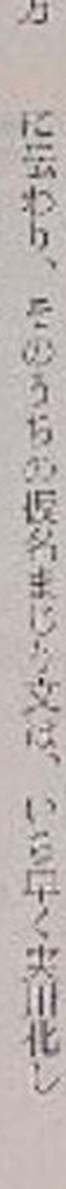に伝わり、そのうちの仮名まじり文は、いち早く実用化し
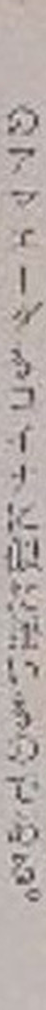のアマエーダもコイナに似た謡いものである。
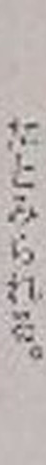たとみられる。
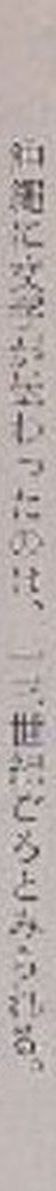沖縄に文字が伝わったのは、一三世紀ごろとみられる。
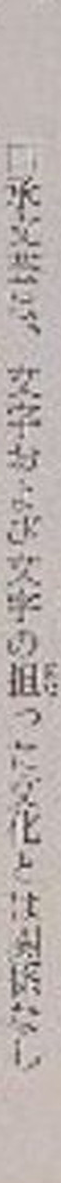口承文芸は、文字および文字の担った文化とは関係なし
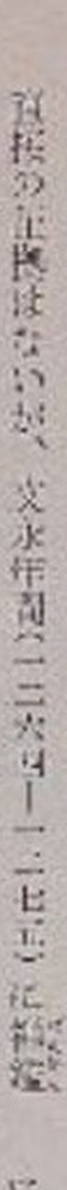直接の証拠はないが、文永年間(一二六四―一二七五)に禅鑑
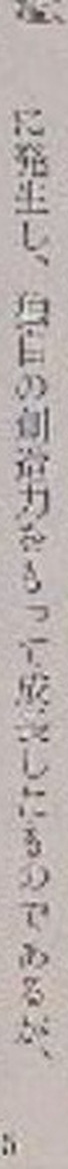に発生し、独自の創造力をもって成長したものであるが、
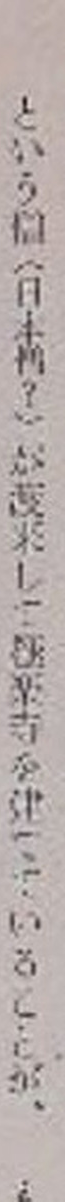という僧(日本僧？)が渡来して極楽寺を建てていることが、
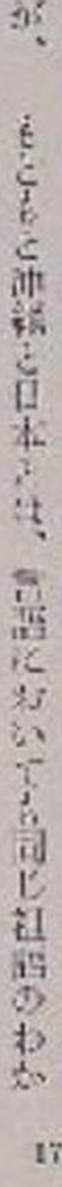もともと沖縄と日本とは、言語においても同じ祖語のわか
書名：沖縄口承文芸
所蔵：University of the Ryukyus Library
